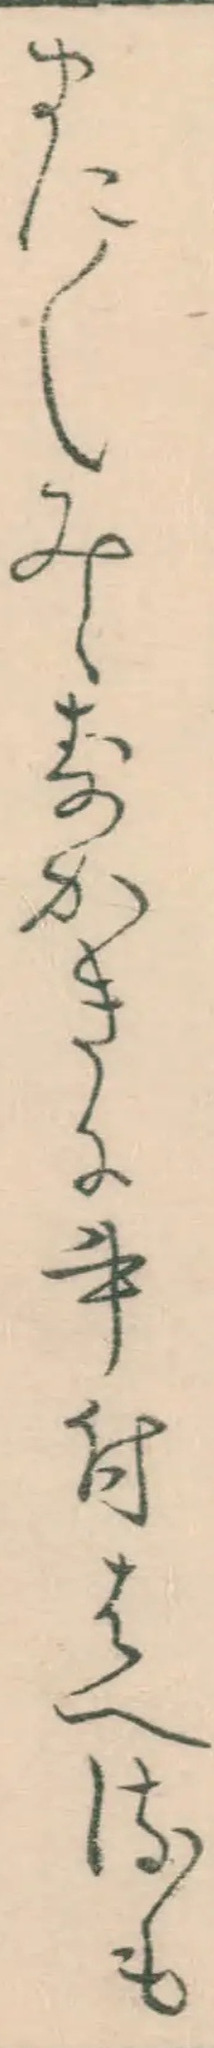まに〳〵みゝすかきに書付はへるも
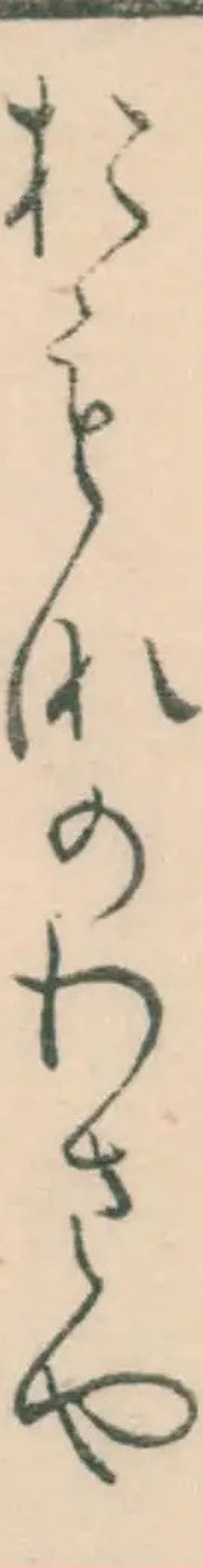おもなのわさや
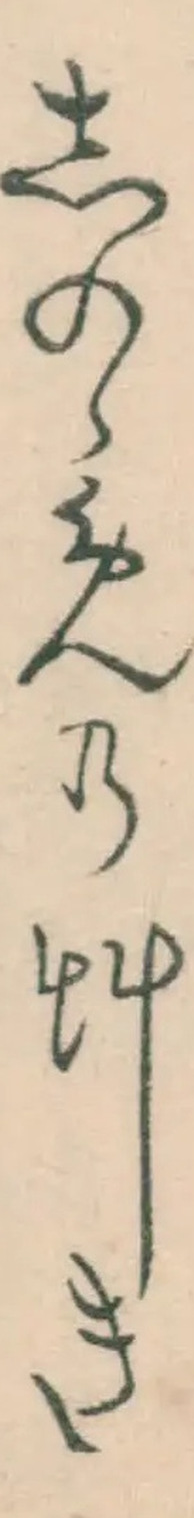しのゝめの艸き
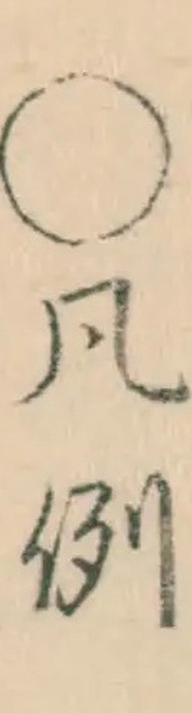○凡例
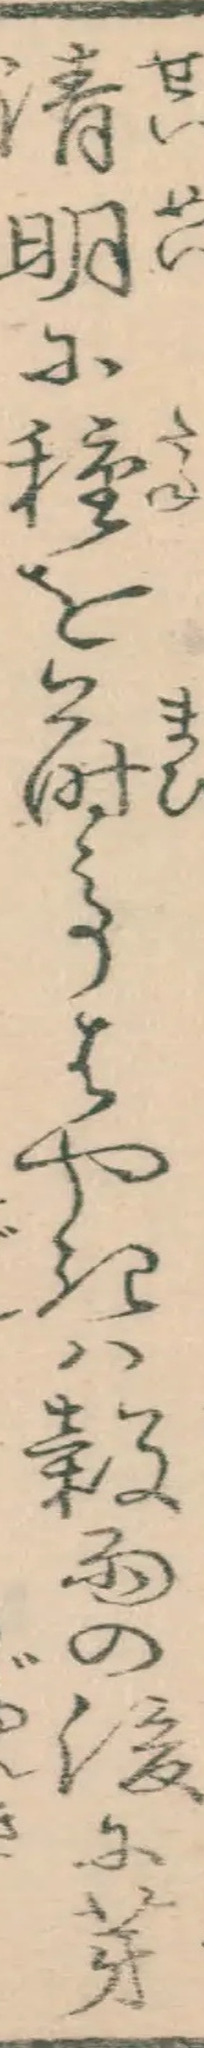清明に種を蒔てはやきは穀雨の後に芽
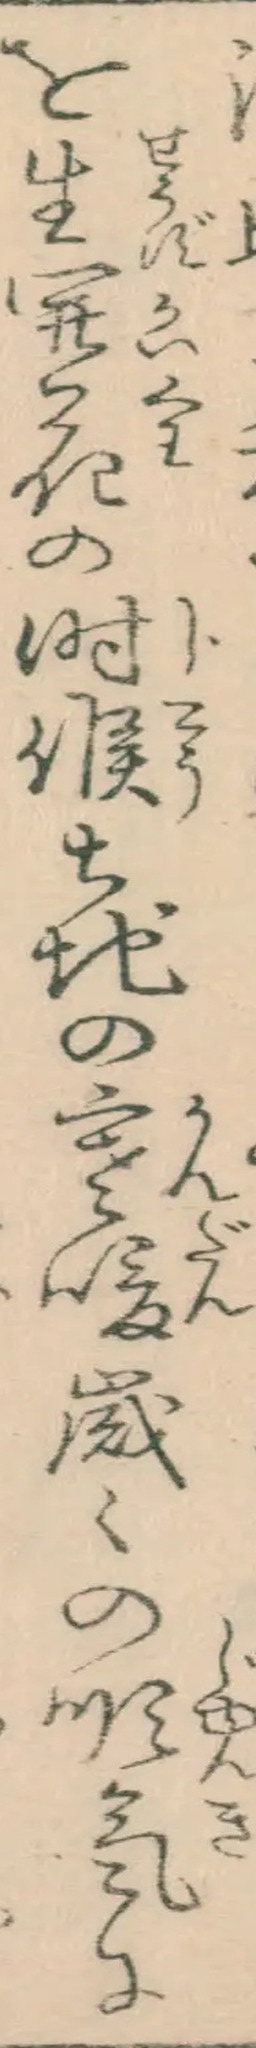を生開花の時候土地の寒暖歳々の順気に
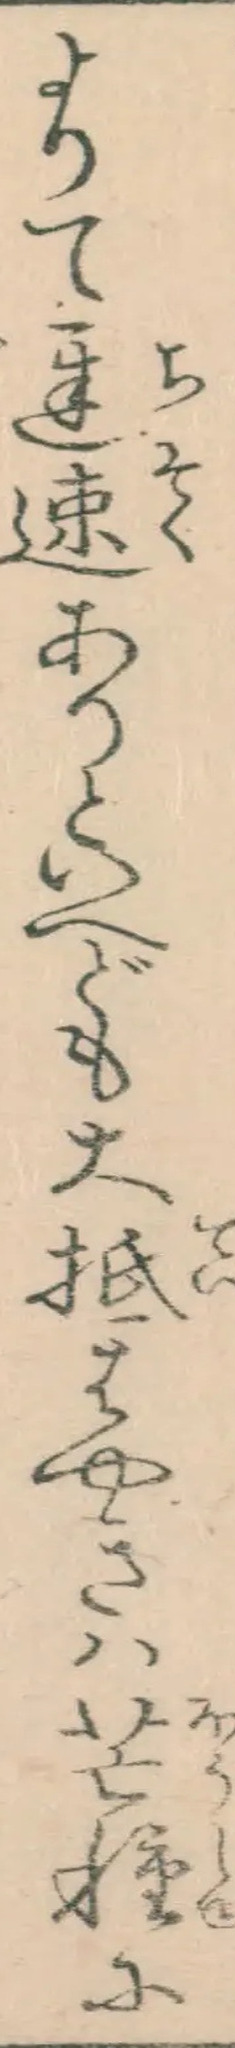よりて遅速ありといへども大抵はやきは芒種に
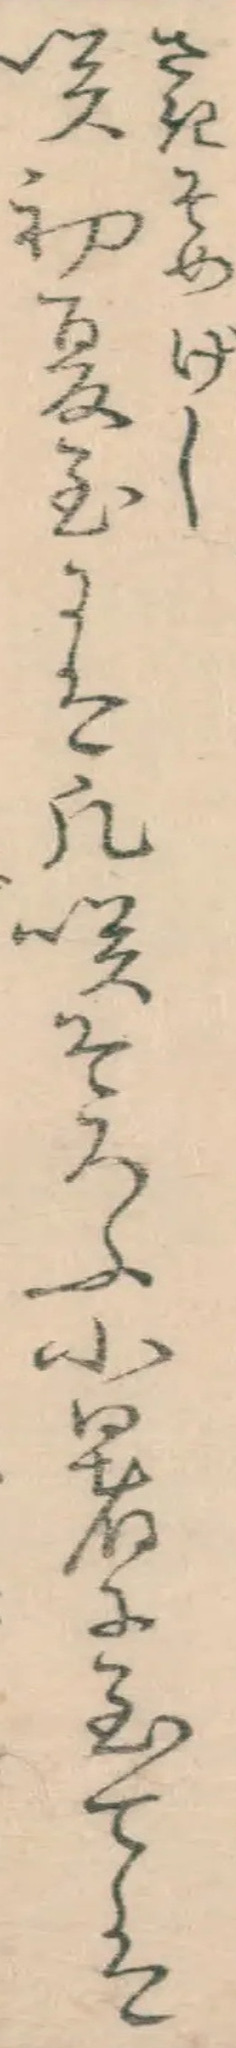咲初夏至には凡咲そろふ小暑に至ては
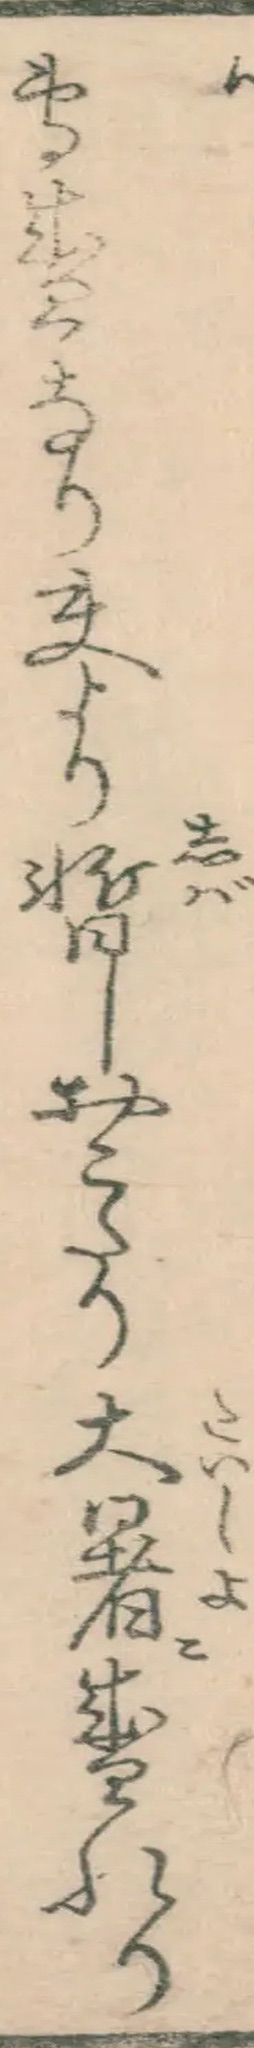専盛なり夫より暫しおこたり大暑に盛れり
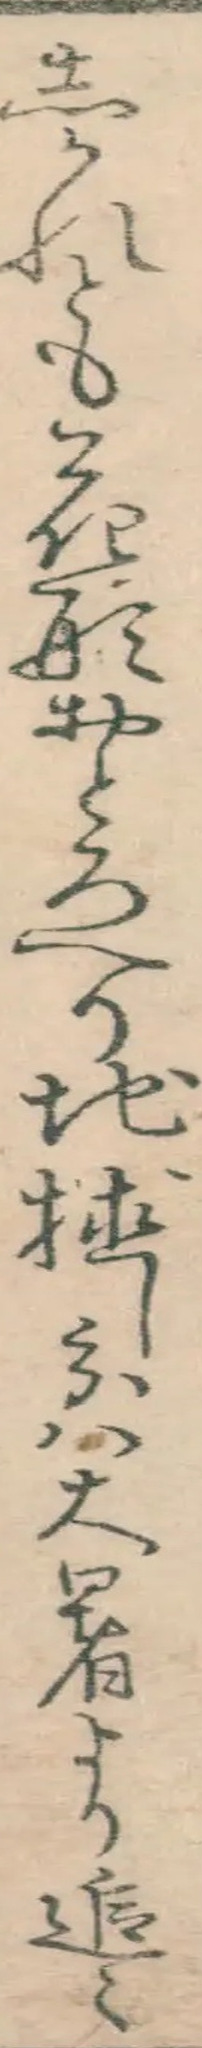しかれとも花形おとろへり地植し分は大暑より追々

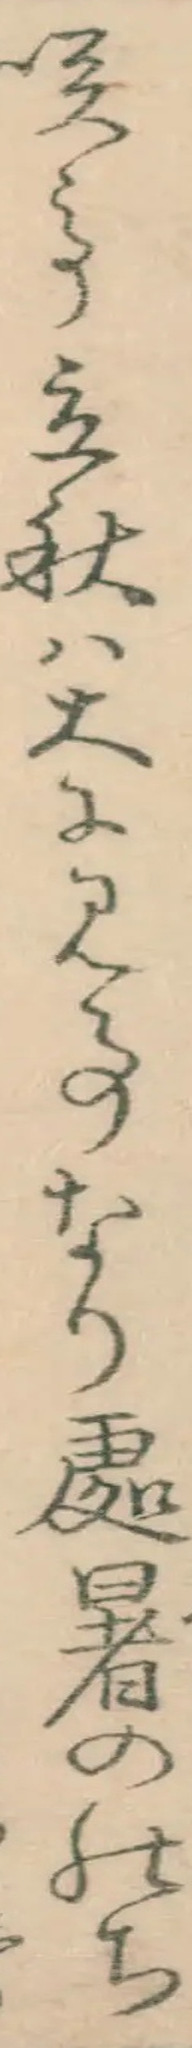咲て立秋は大に見事なり処暑ののち
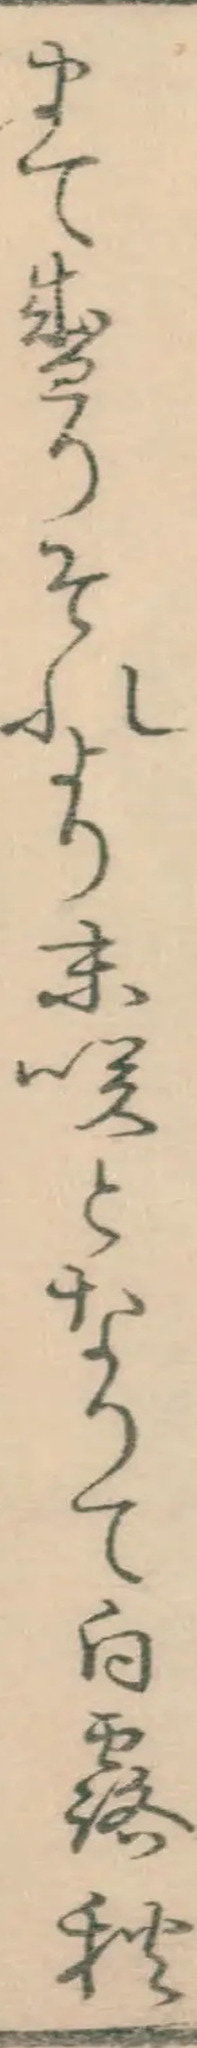まて盛りそれより末咲となりて白露秋
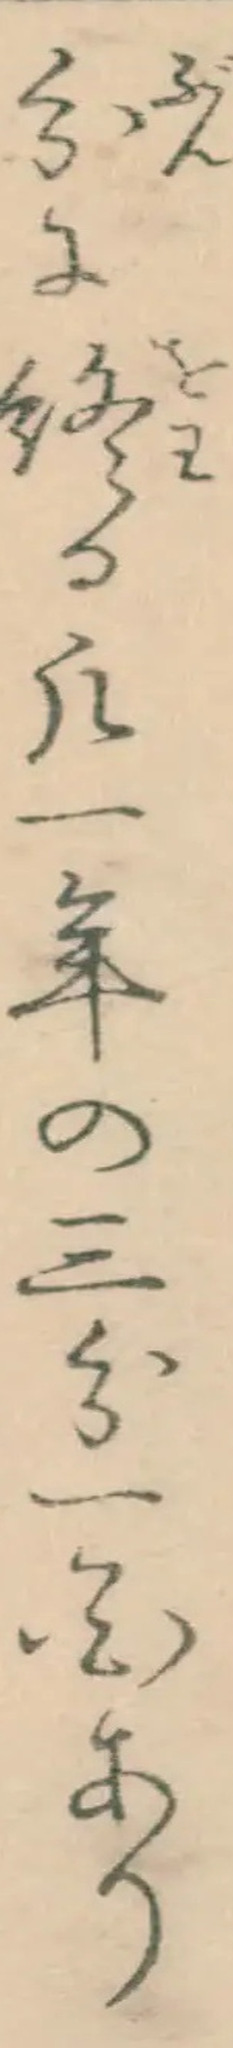分に終る凡一年の三分一花あり
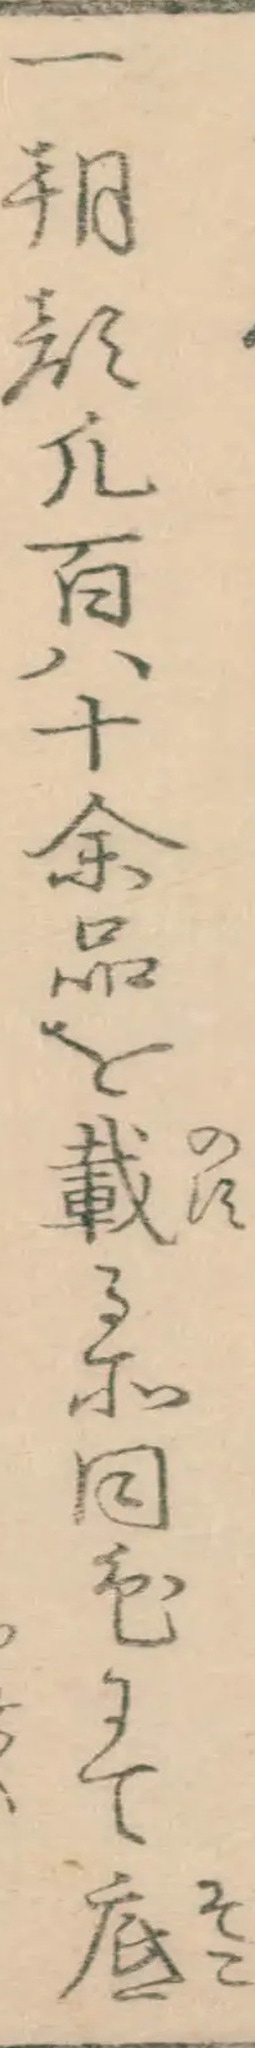一朝顔百八十余品を載る所同色にて底
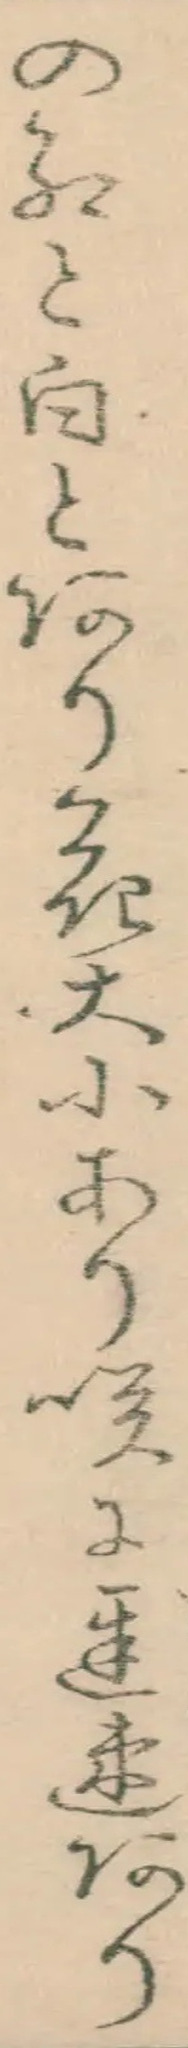の紅と白とあり花大小あり咲に遅速あり
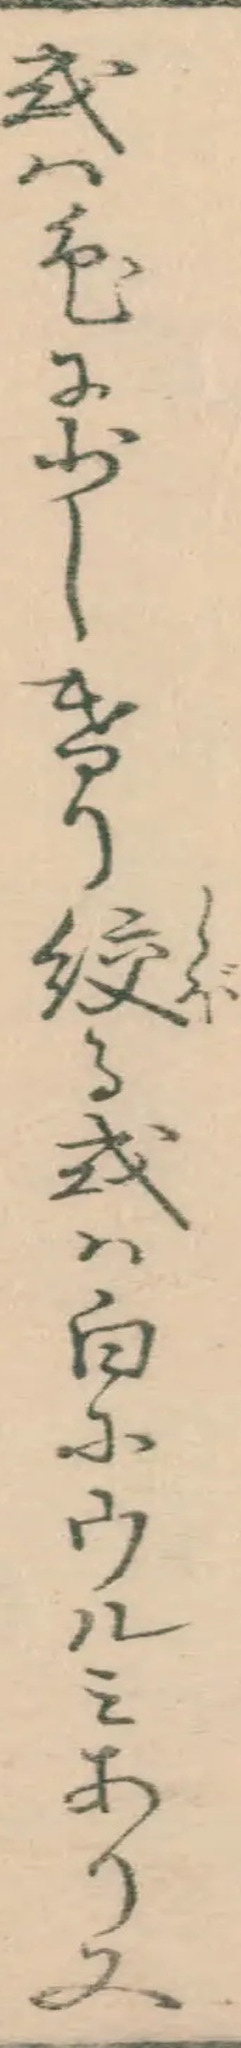或は色に少し替り絞る或は白にウルミあり又
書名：花壇朝顔通 2巻. [1]
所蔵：国立国会図書館 National Diet Library, JAPAN
